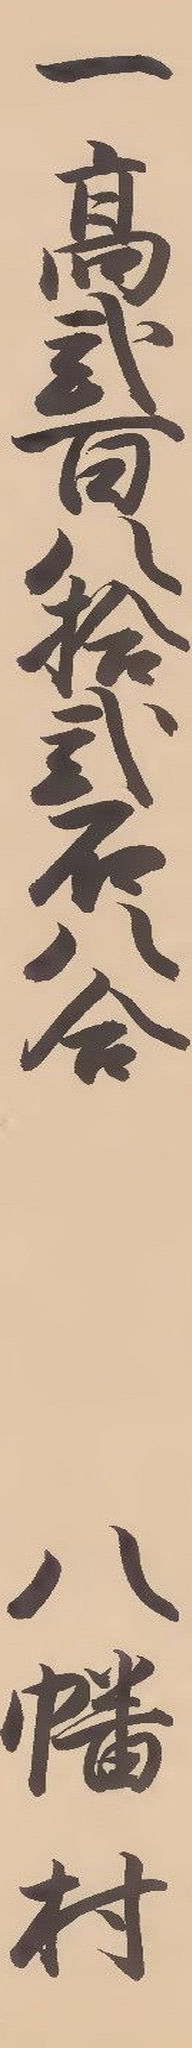一髙弐百八拾弐石八合八幡村
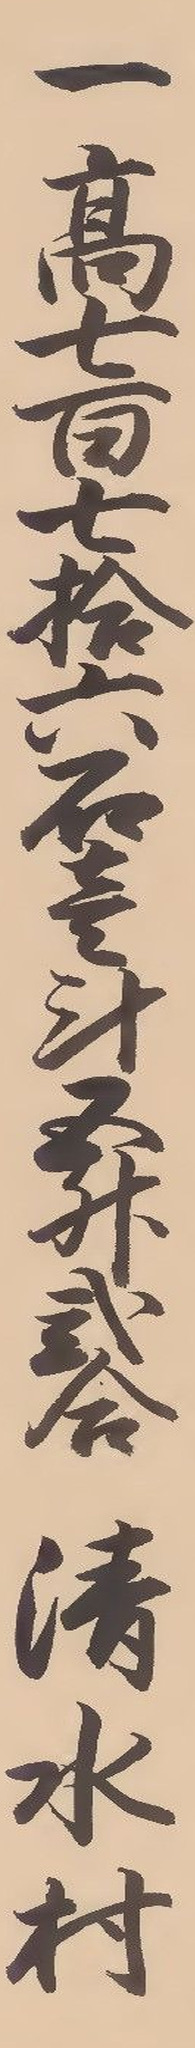一髙七百七拾六石壱斗五升弐合清水村
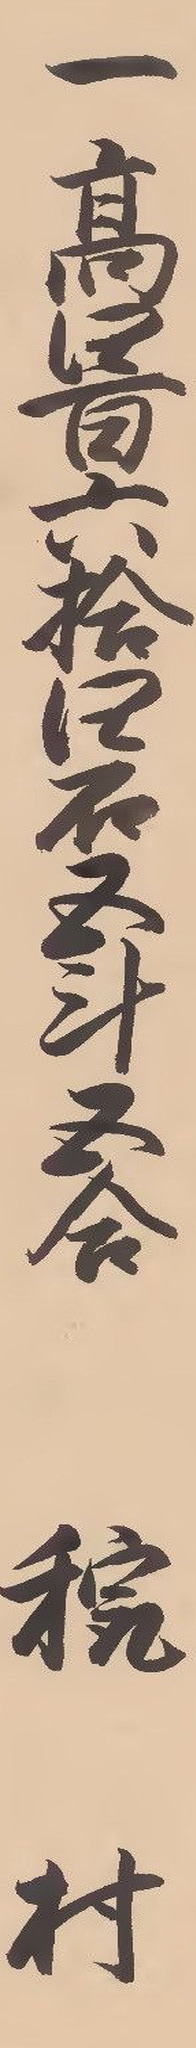一髙四百六拾四石五斗五合村
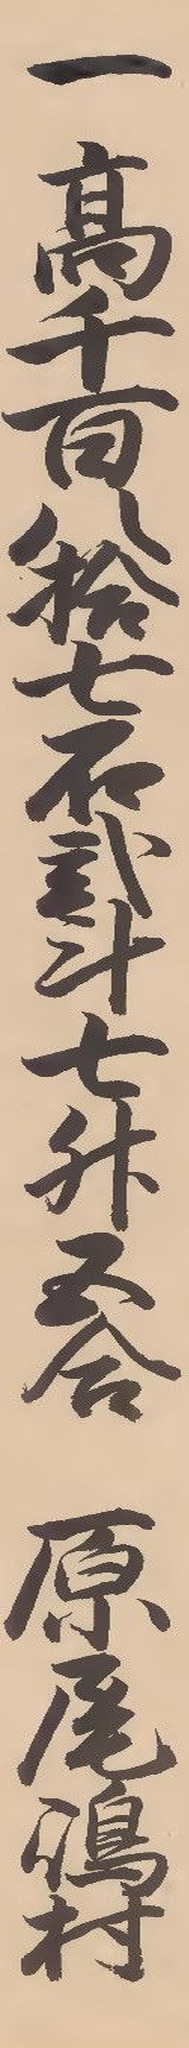一髙千百八拾七石弐斗七升五合原尾嶋村
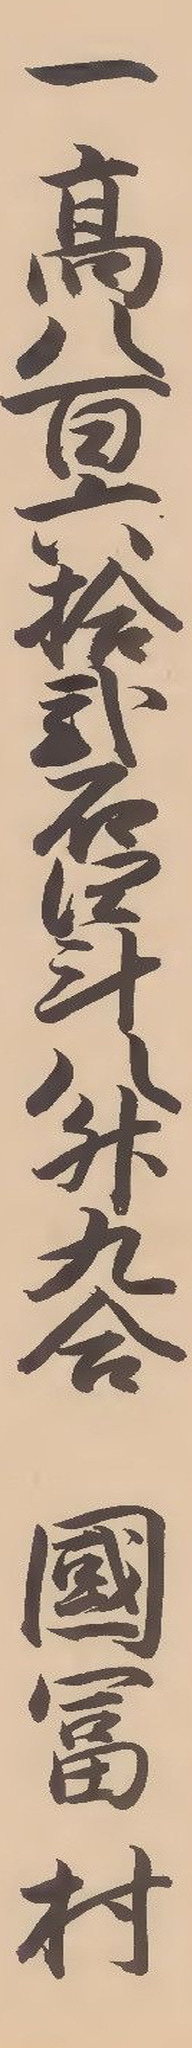一髙八百六拾弐石四斗八升九合國冨村
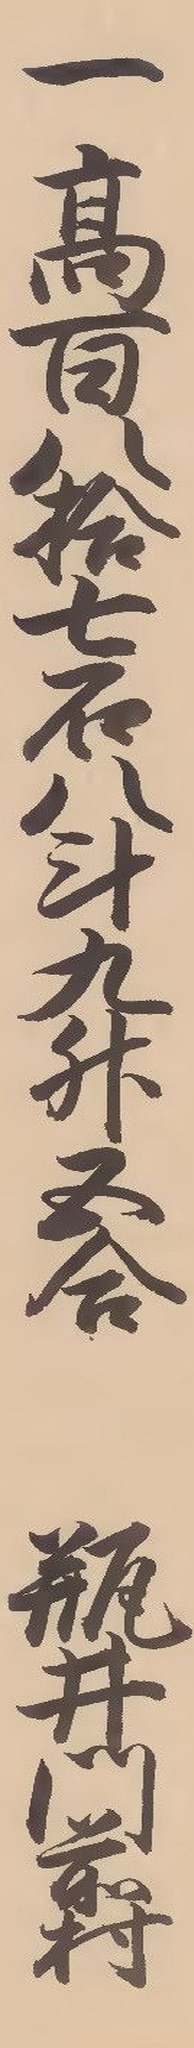一髙百八拾七石八斗九升五合瓶井門前村
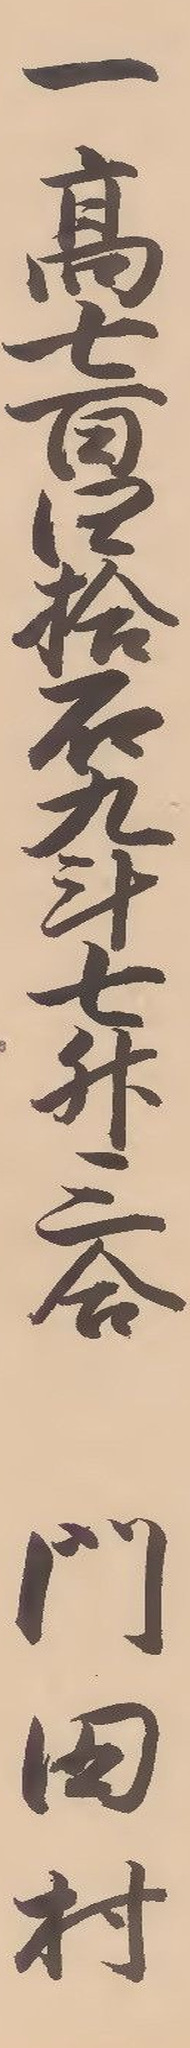一髙七百四拾石九斗七升三合門田村

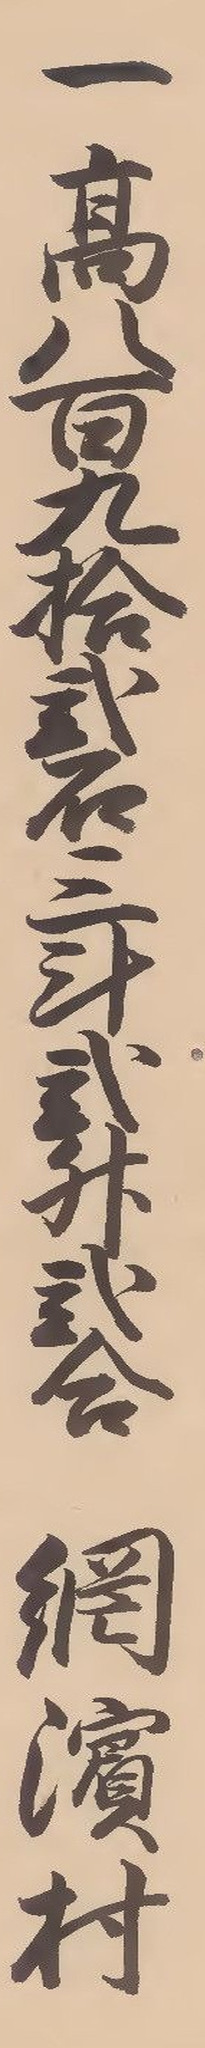一髙八百九拾弐石三斗弐升弐合網浜村
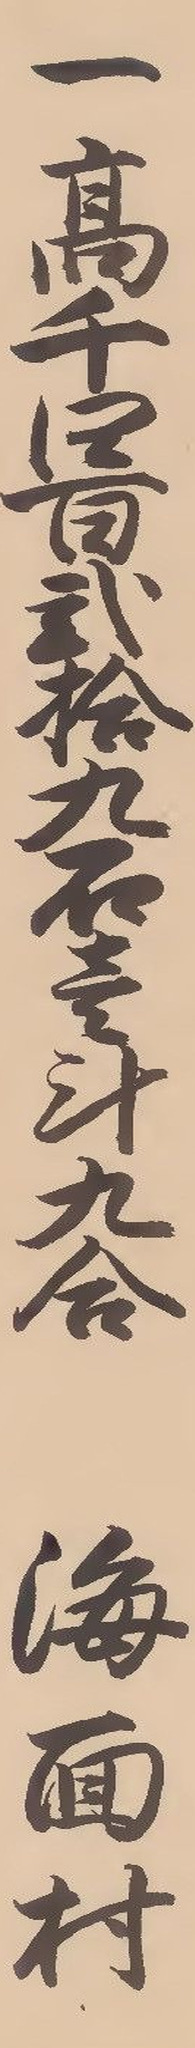一髙千四百弐拾九石壱斗九合海面村
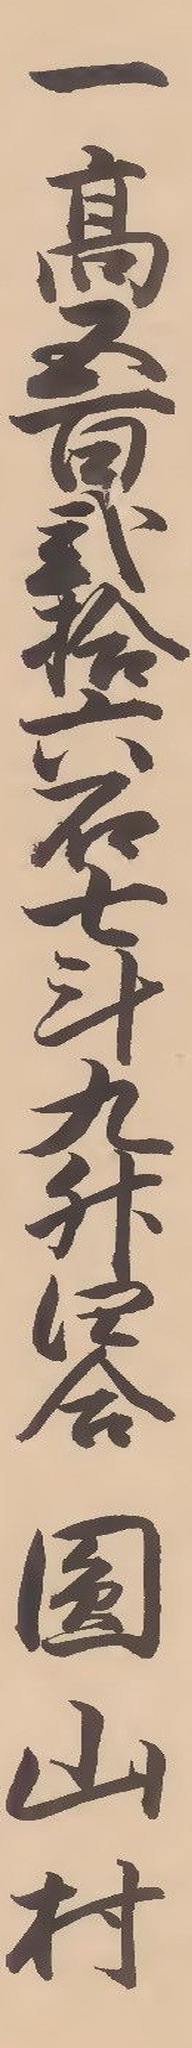一髙五百弐拾六石七斗九升四合圓山村
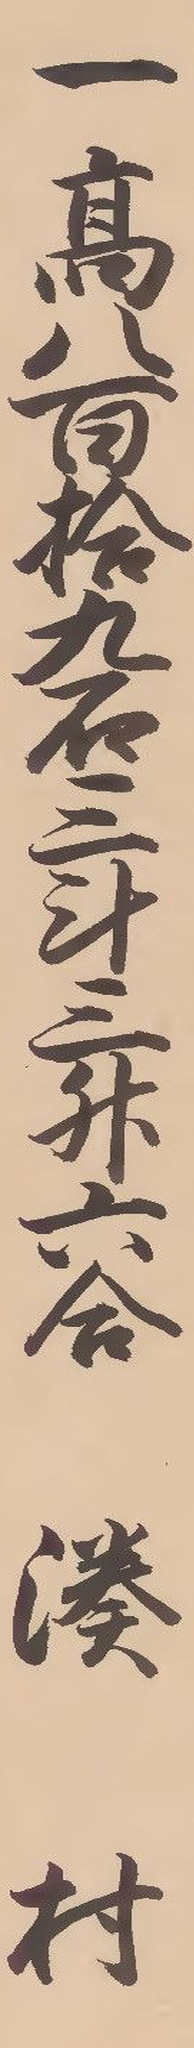一髙八百拾九石三斗三升六合湊村
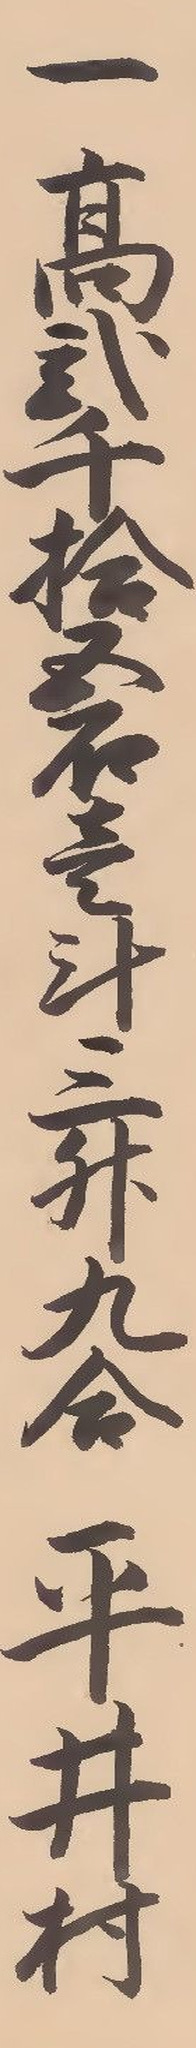一髙弐千拾五石壱斗三升九合平井村
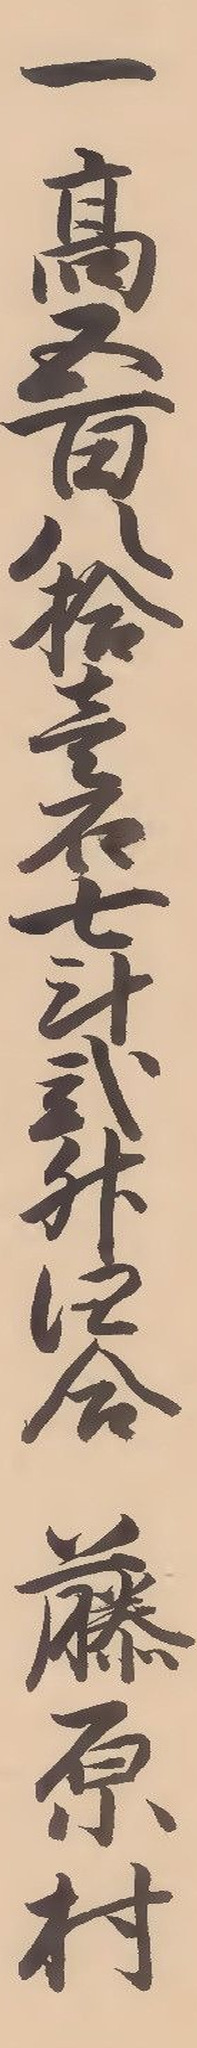一髙五百八拾壱石七斗弐升四合藤原村
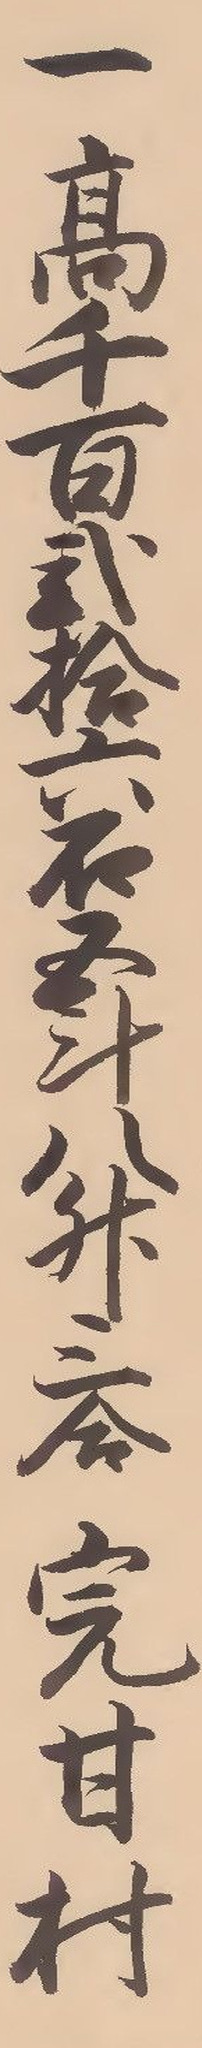一髙千百弐拾六石五斗八升三合完甘村
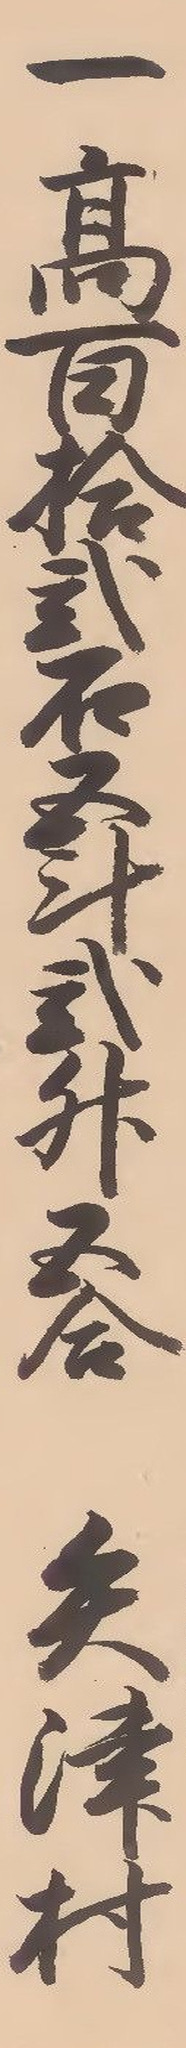一髙百拾弐石五斗弐升五合矢津村

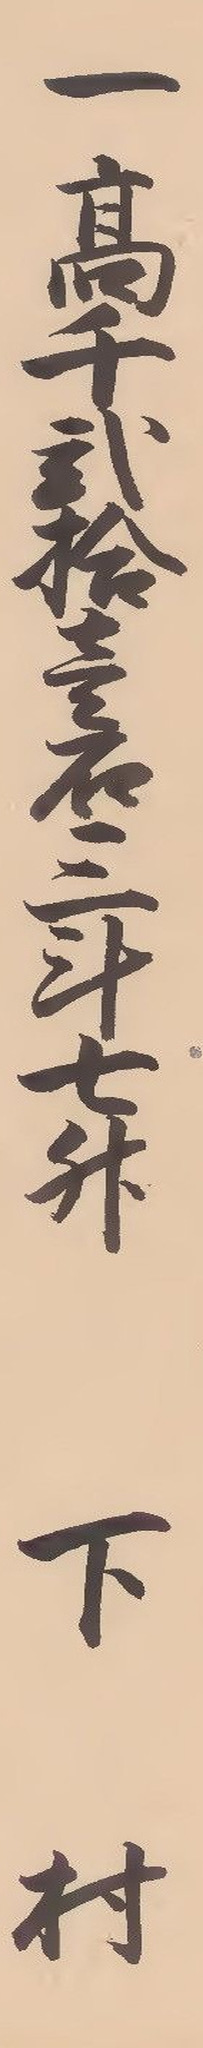一髙千弐拾壱石三斗七升下村
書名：備前国郷帳
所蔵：国立公文書館 National Archives of Japan
